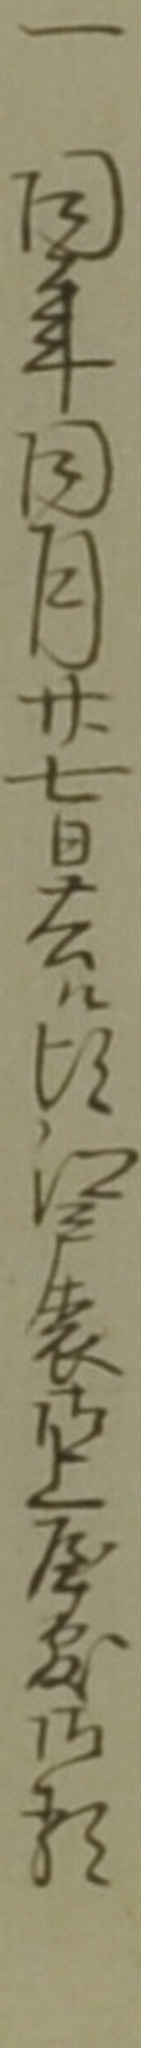一同年同月廿七日去ル頃江戸表御上屋敷御類
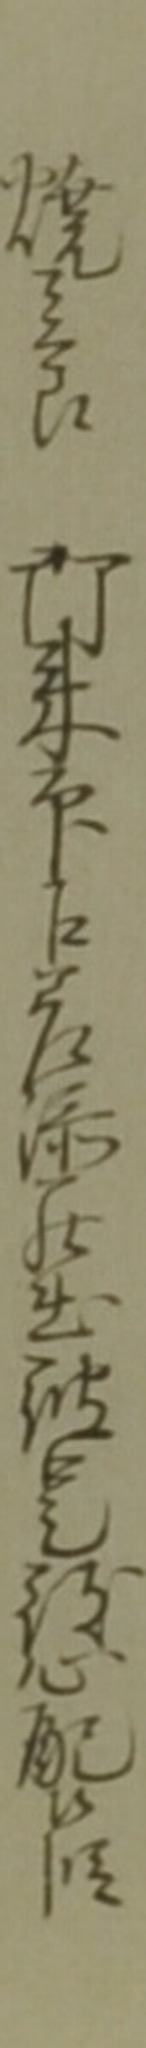焼之節御朱印江差添罷出彼是致心配候段
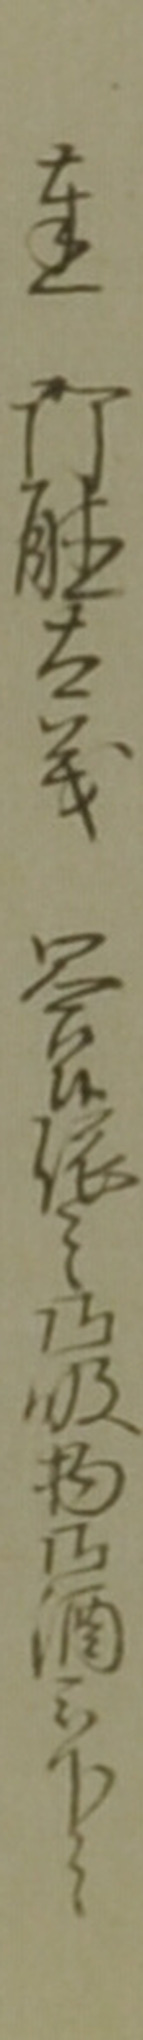達御聴太義思召候依之御吸物御酒被下之
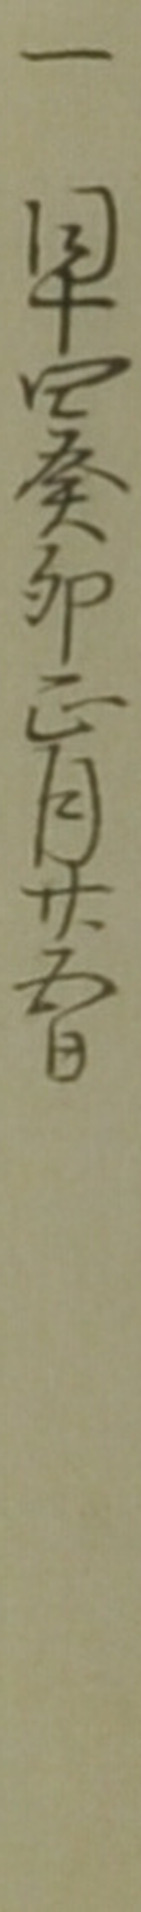一同十四癸卯正月廿五日
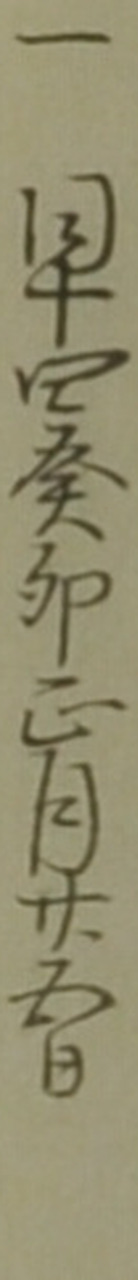一同十四癸卯正月廿五日
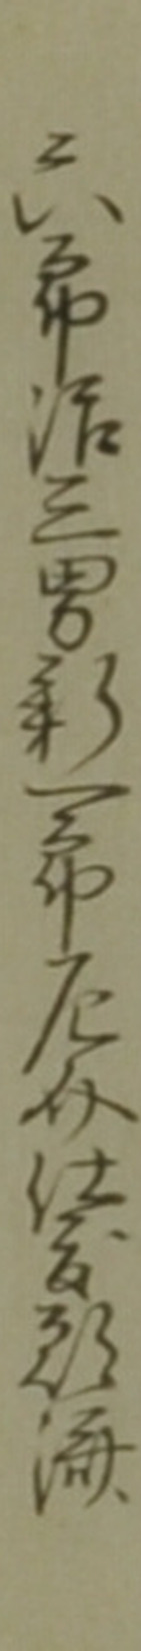六郎治三男新一郎厄介仕度願済
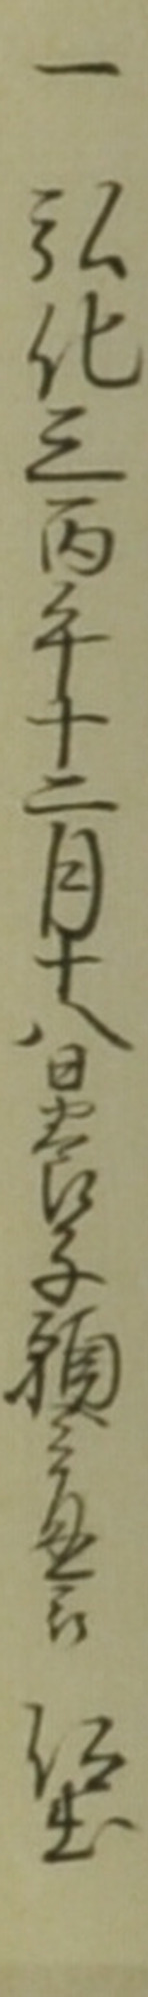一弘化三丙午十二月十八日養子願之通被仰出
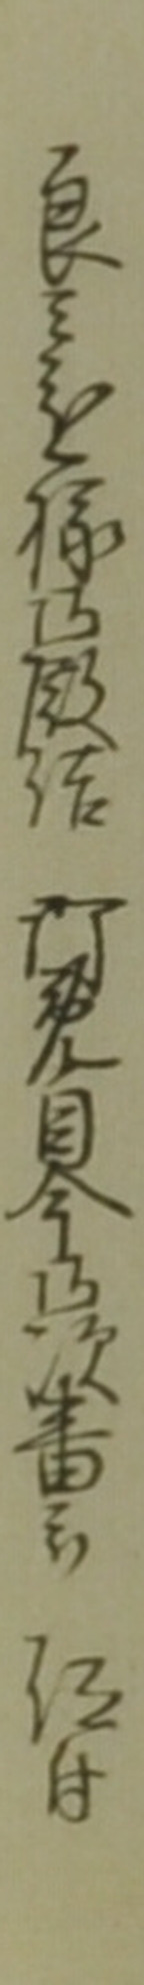良之進様御殿詰御免自今御次番被仰付

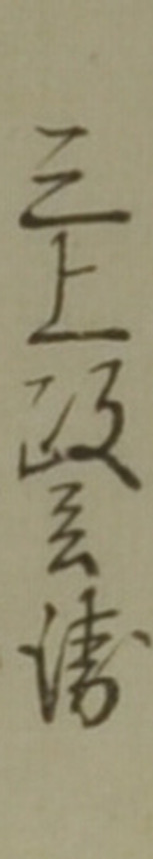三上政兵衛

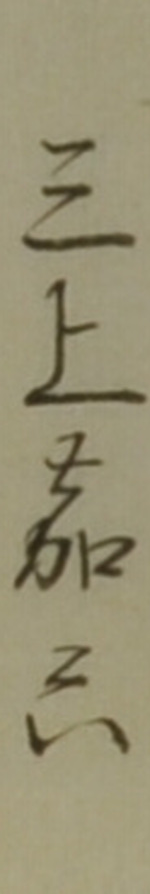三上嘉六

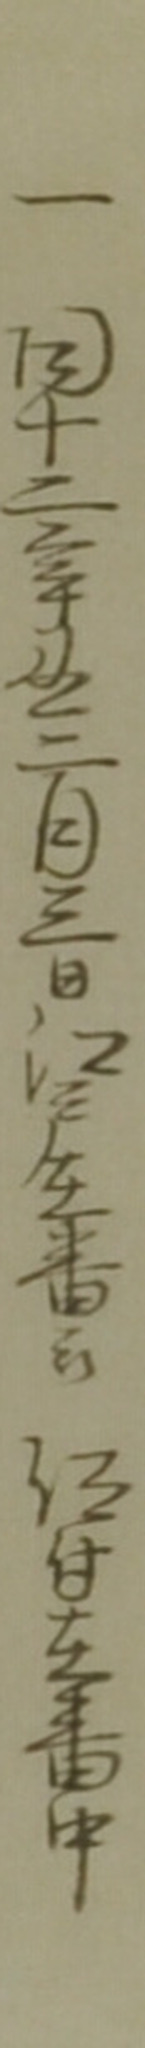一同十二辛丑三月三日江戸在番被仰付在番中

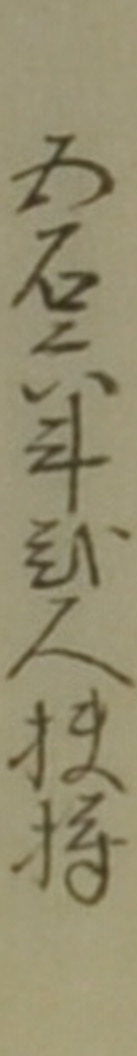五石六斗弐人扶持
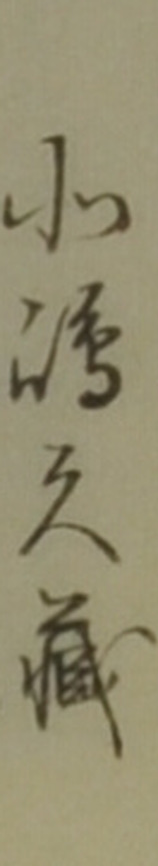北嶋久蔵
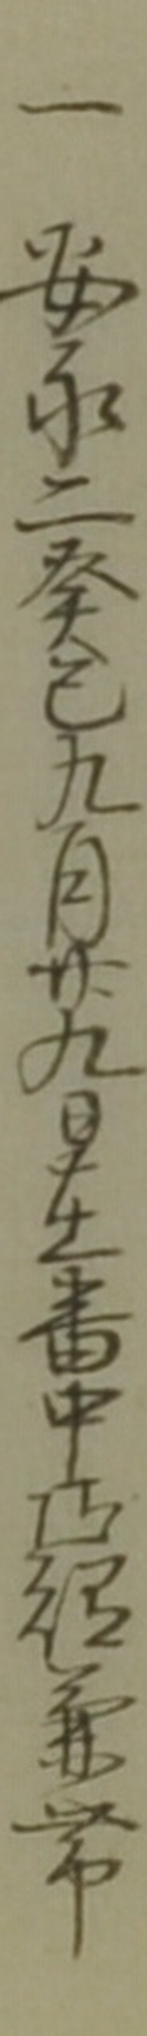一安永二癸巳九月廿九日在番中御賄兼帯

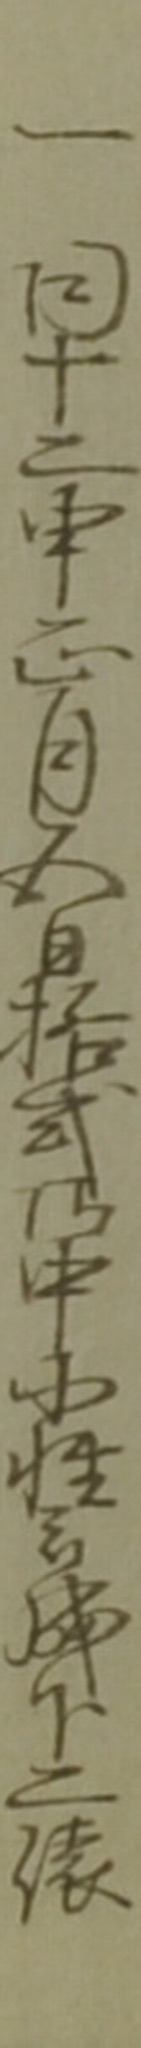一同十二申正月五日格式御中小性被成下二俵
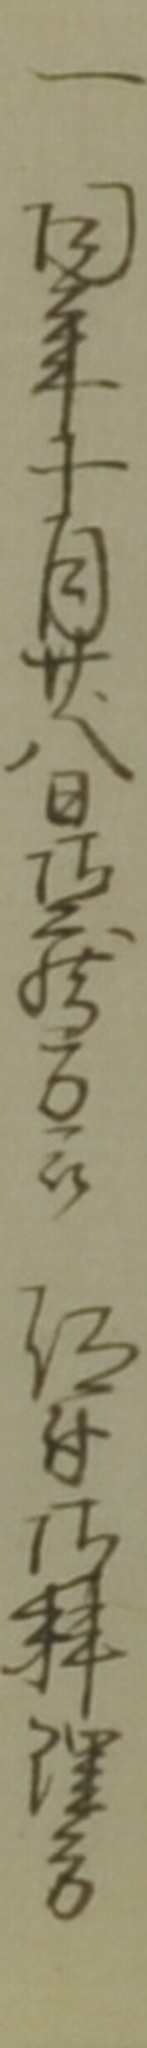一同年十月廿八日御蔵方被仰付御料理方
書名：無足諸士勤仕録（五）
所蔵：伊那市立高遠町図書館・合同会社AMANE
